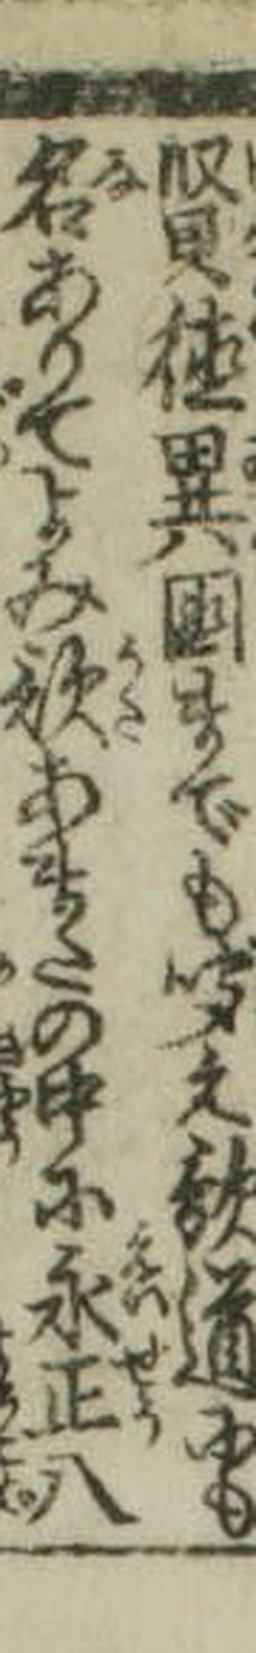名ありてよみ歌あまたの中に永正八
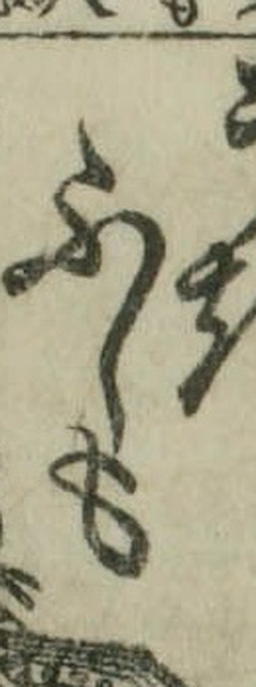ふしも
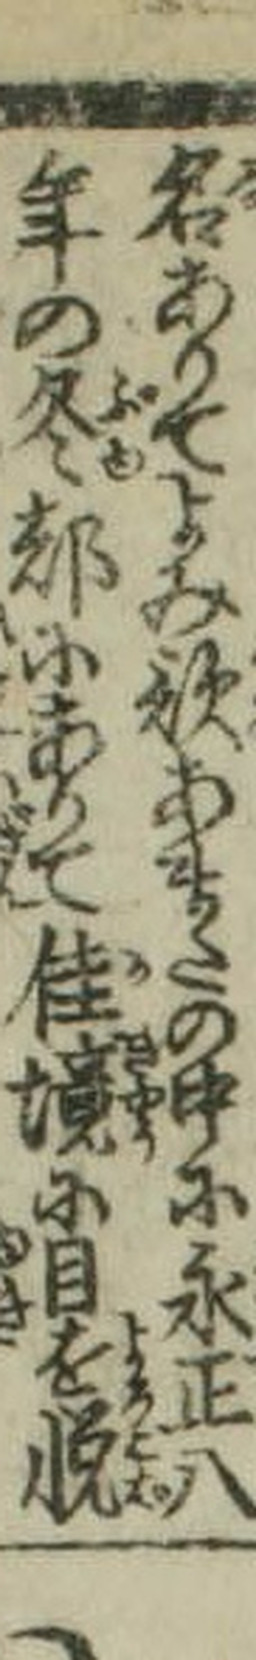年の冬都にありて佳境に目を悦
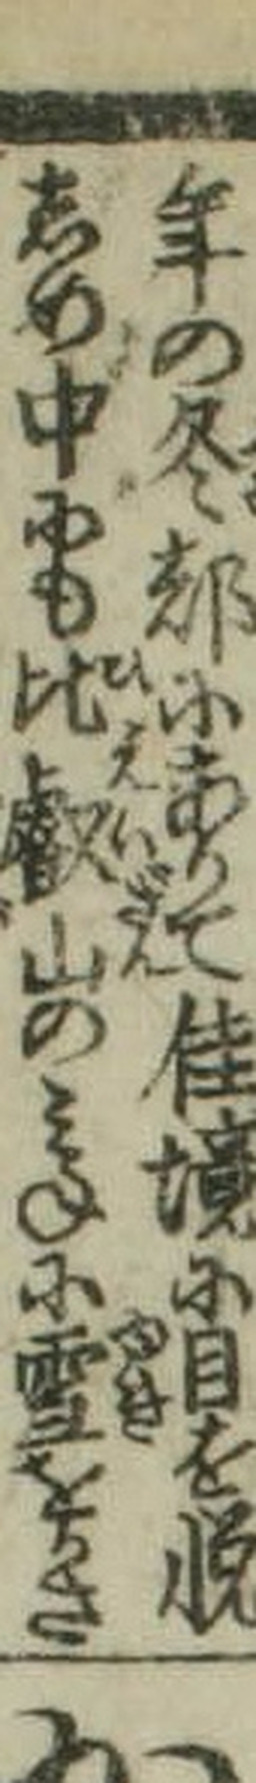しめ中にも比叡山のみねに雪をかさ
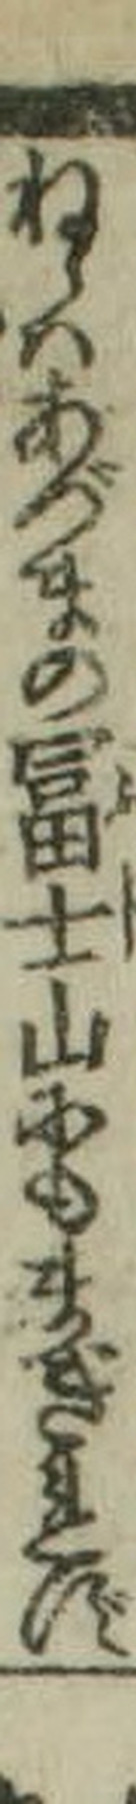ねしはあづまの富士山にもまぎれず
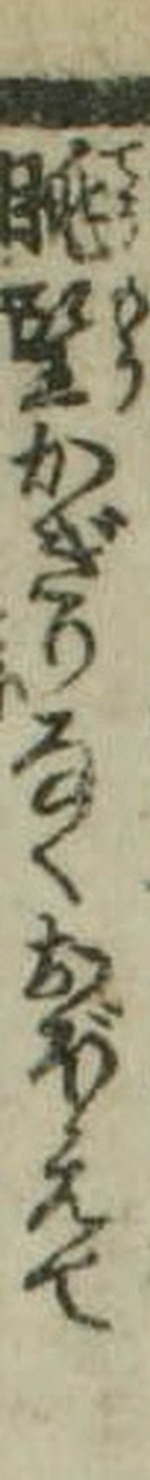眺望かぎりなくおぼえて
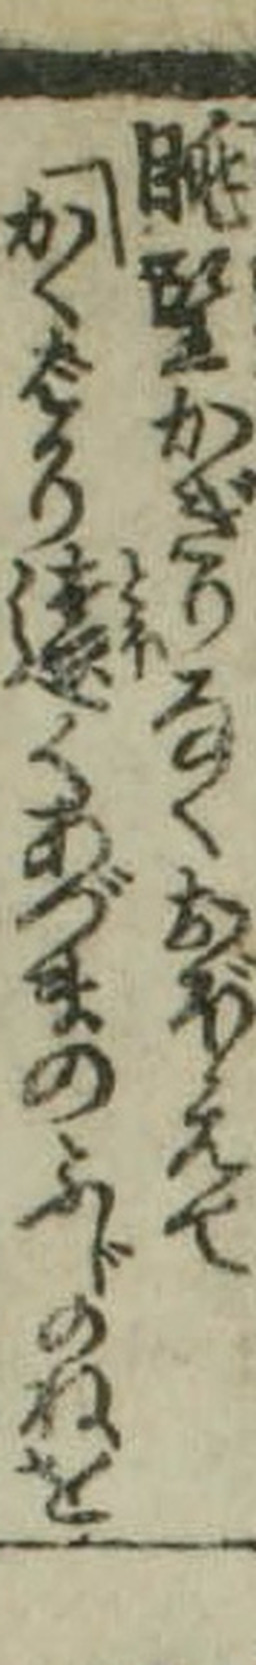〽かくばかり遠くあづまのふじのねを
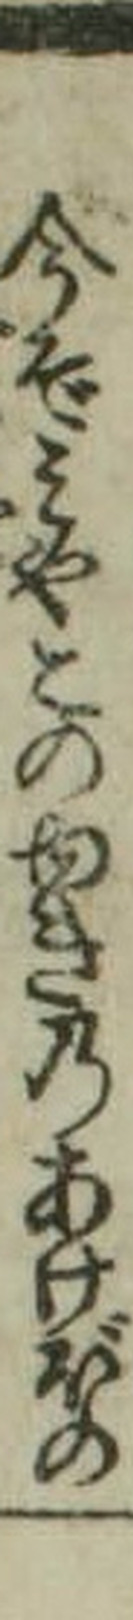今ぞみやこのゆきのあけぼの
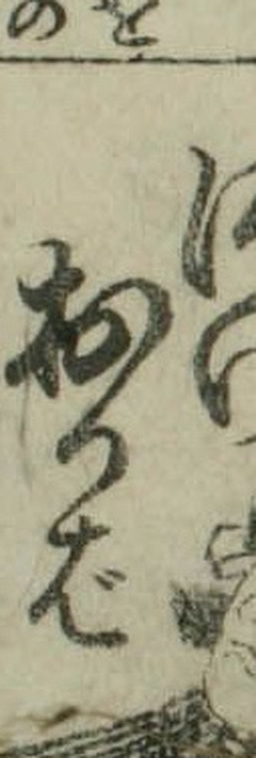おかば
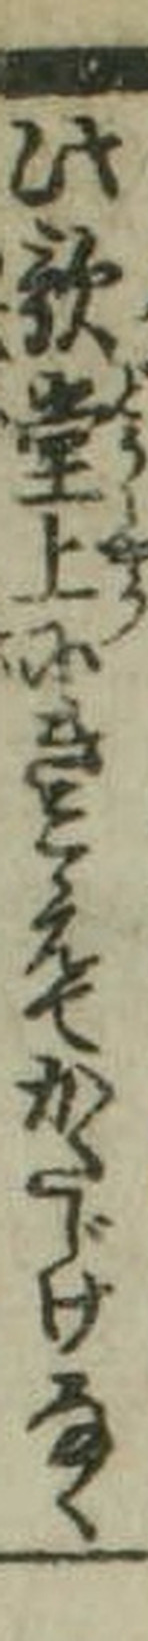此歌堂上にきこえてかたじけなく
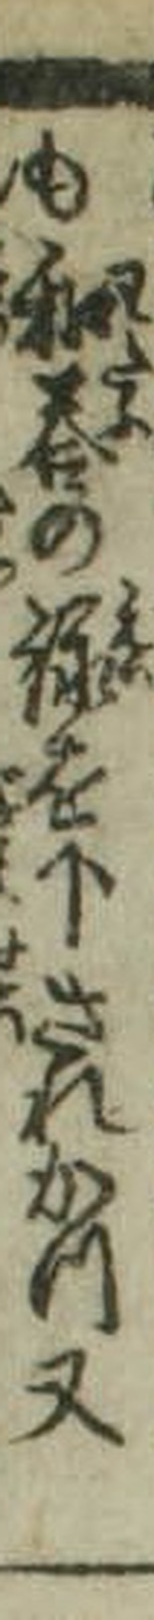も和答の詠を下されかつ又
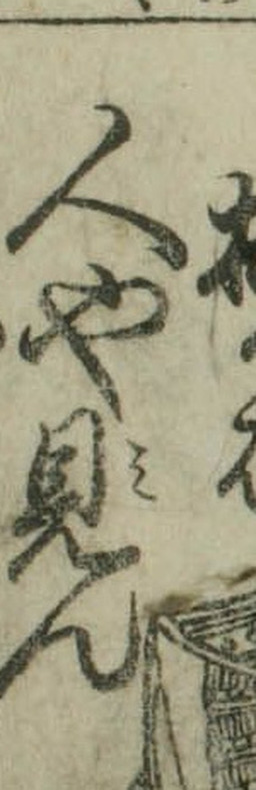人や見ん
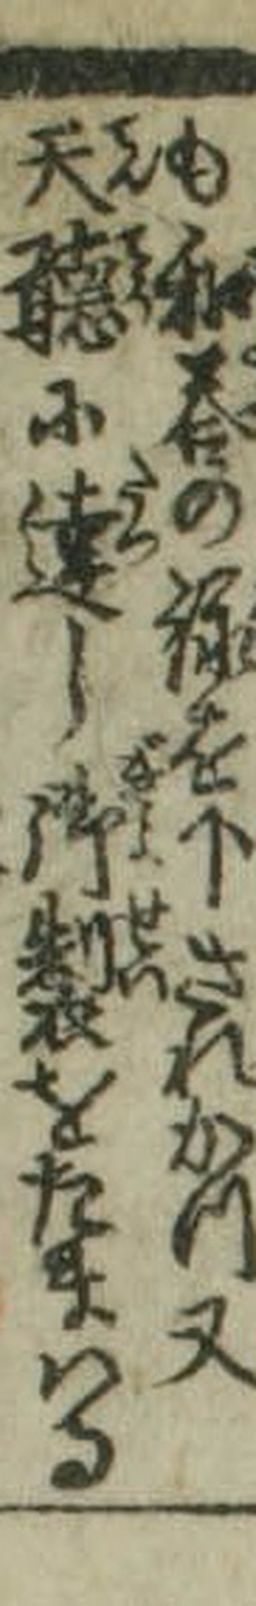天聴に達し御製をたまはる
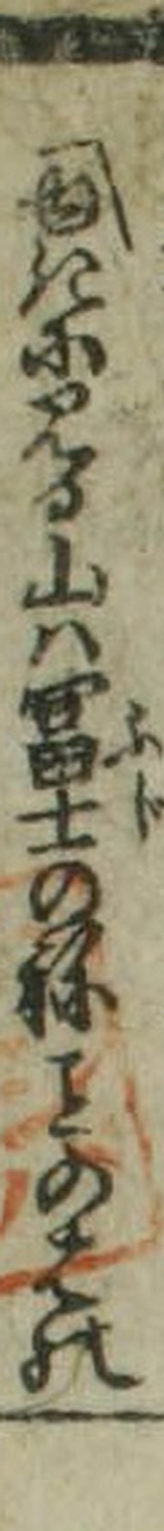〽ゆきに見る山は富士のねことのはの
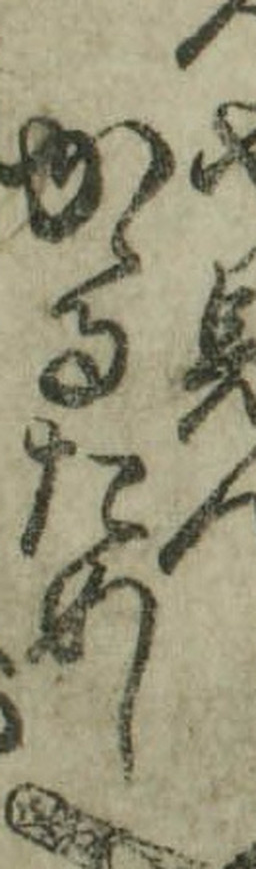かゝるためしも
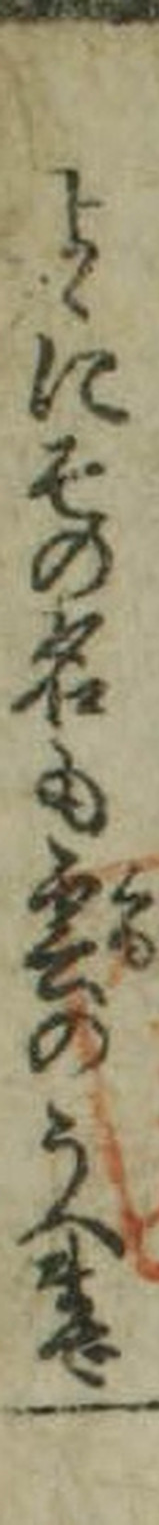よゝにその名も雲のうへまで
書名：續英雄百人一首
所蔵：東京学芸大学附属図書館
